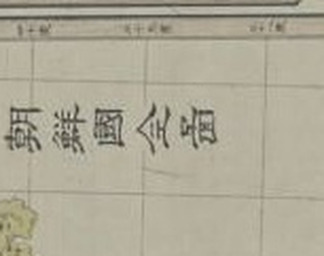朝鮮国全図
